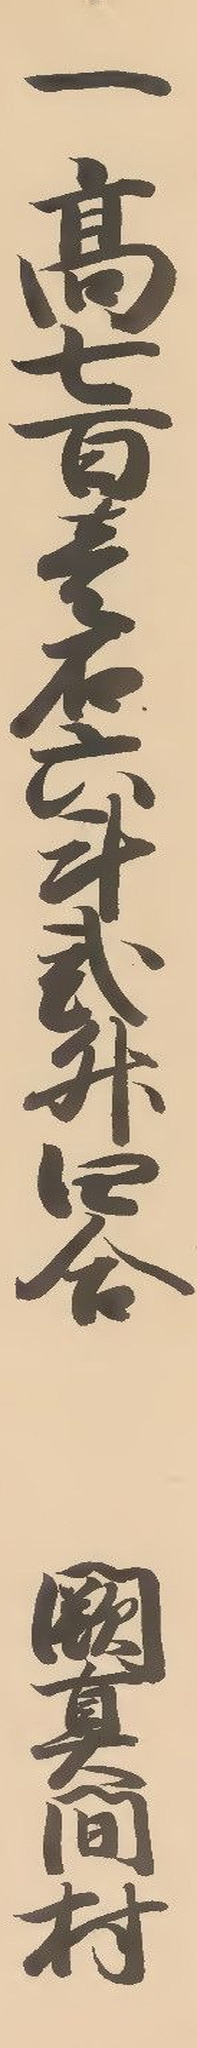一高七百壱石六斗弐升四合闕真間村
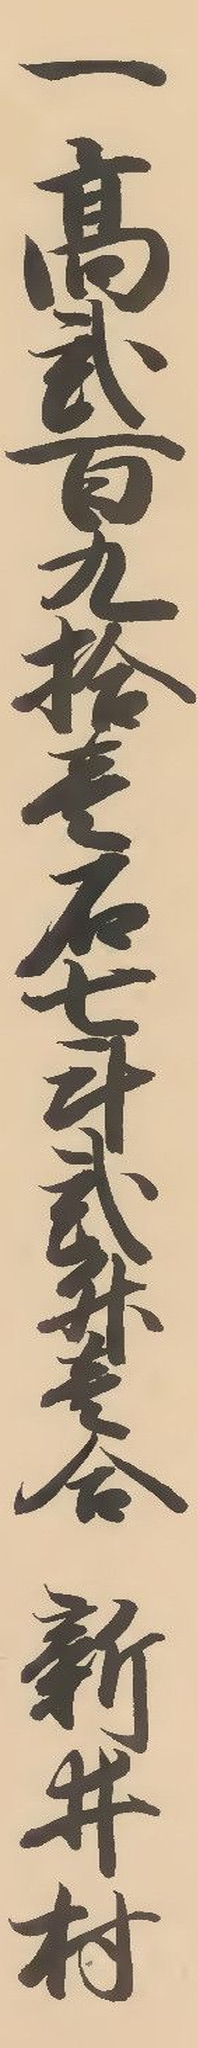一高弐百九拾壱石七斗弐升壱合新井村
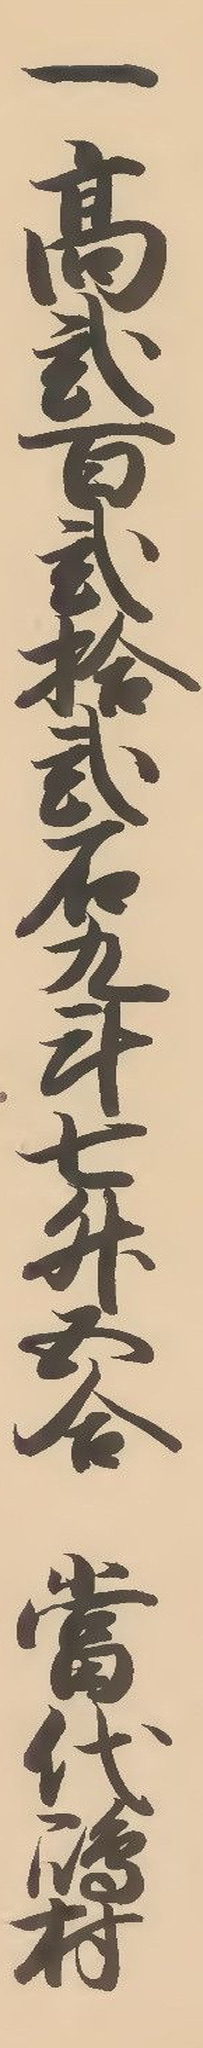一高弐百弐拾弐石九斗七升五合当代島村

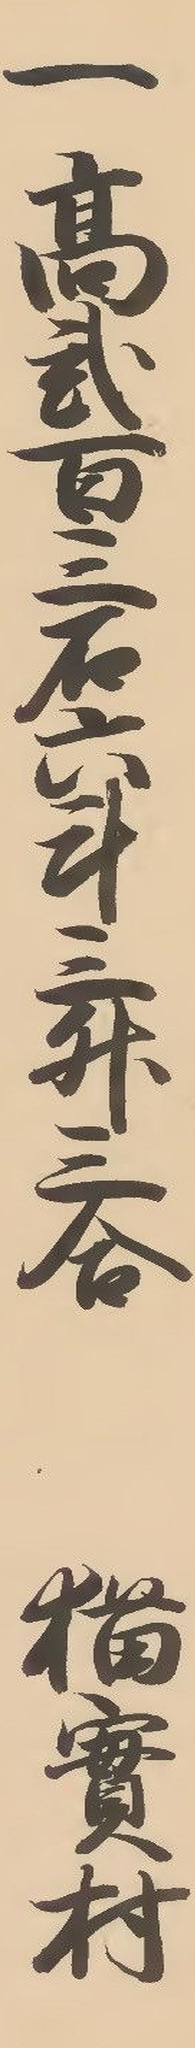一高弐百三石六斗三升三合猫実村
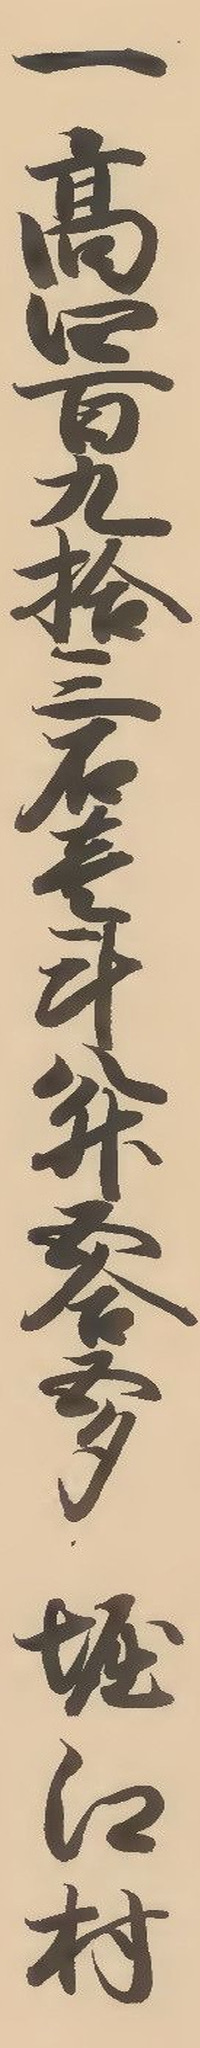一高四百九拾三石壱斗八升五合五勺堀江村
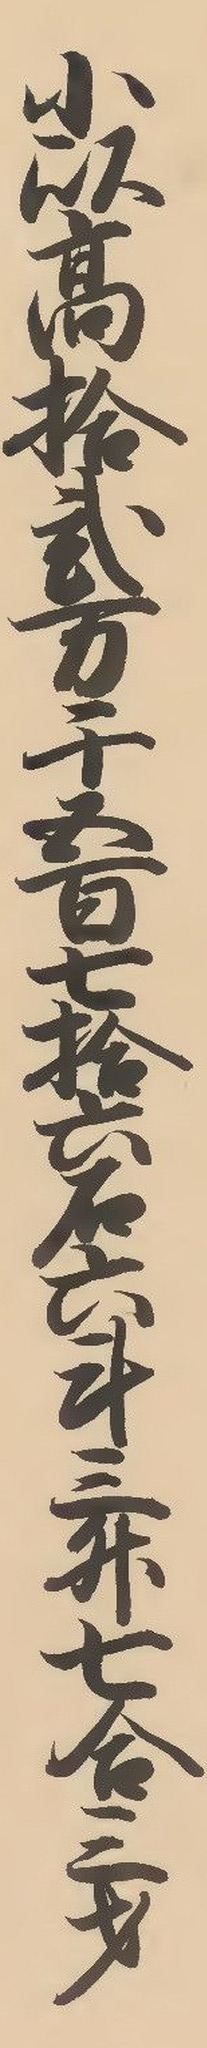小以高拾弐万千五百七拾六石六斗三升七合三才
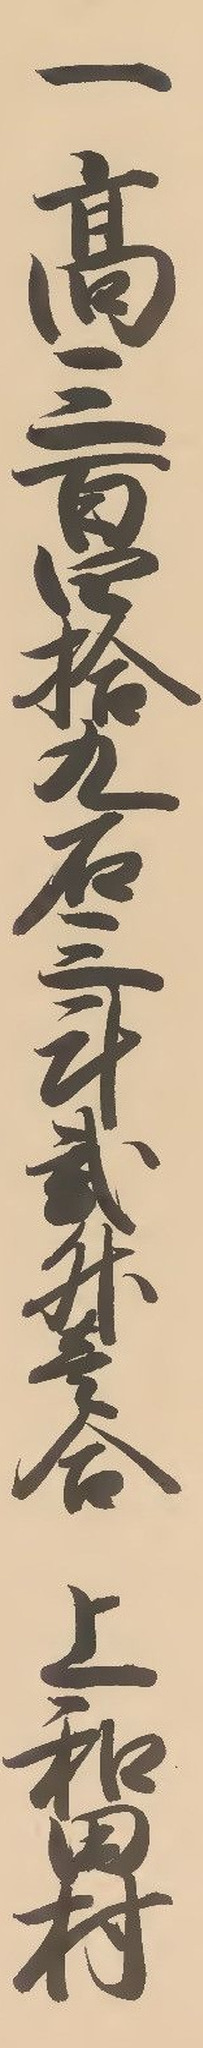一高三百四拾九石三斗弐升壱合上和田村
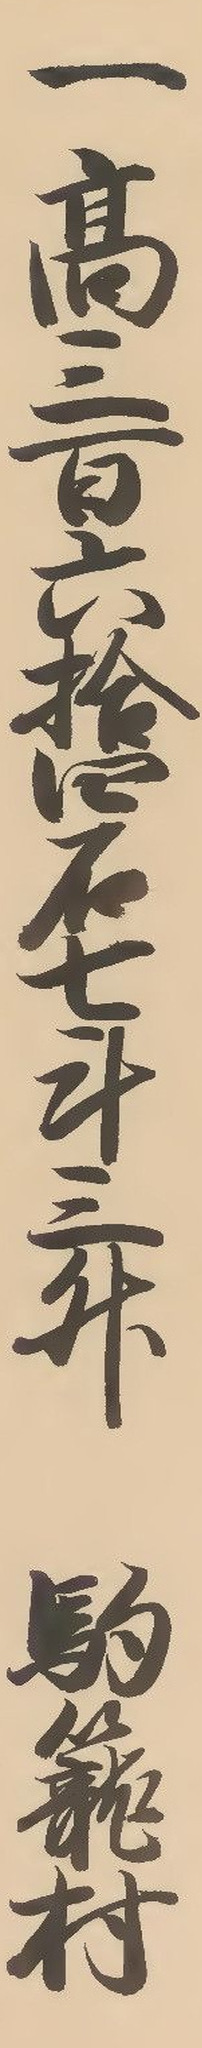一高三百六拾四石七斗三升駒籠村
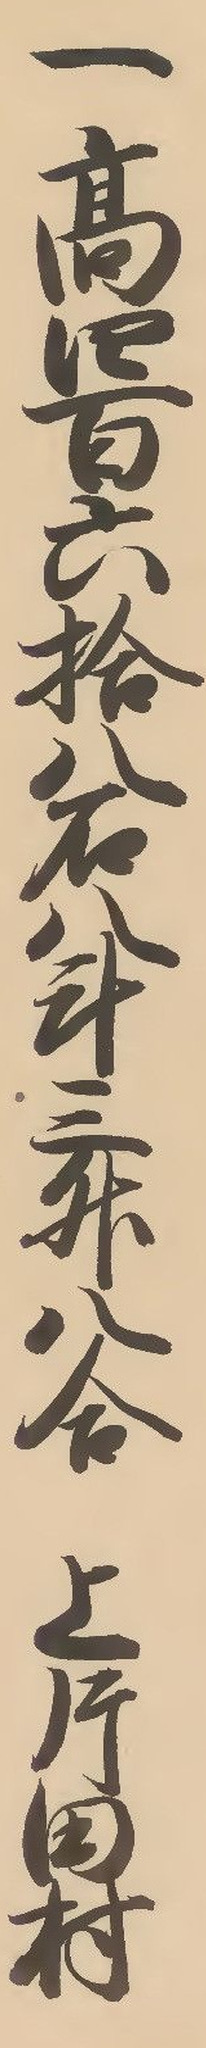一高四百六拾八石八斗三升八合上片田村

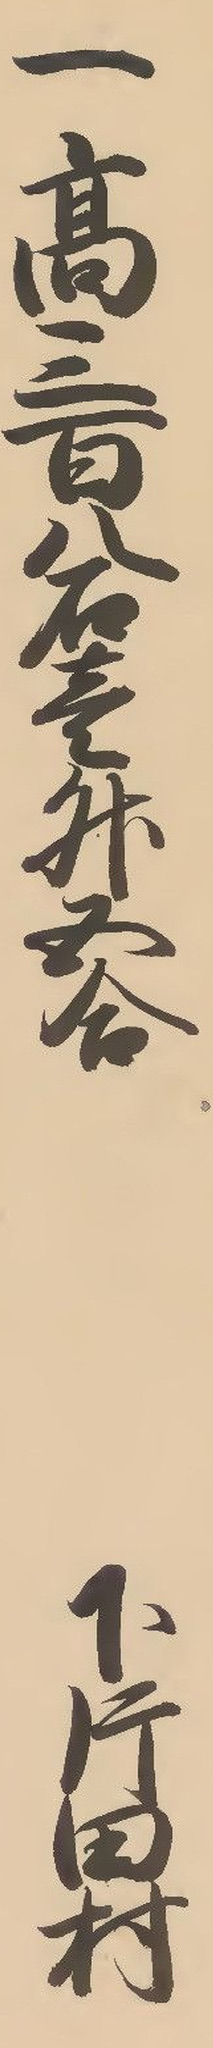一高三百八石壱升五合下片田村
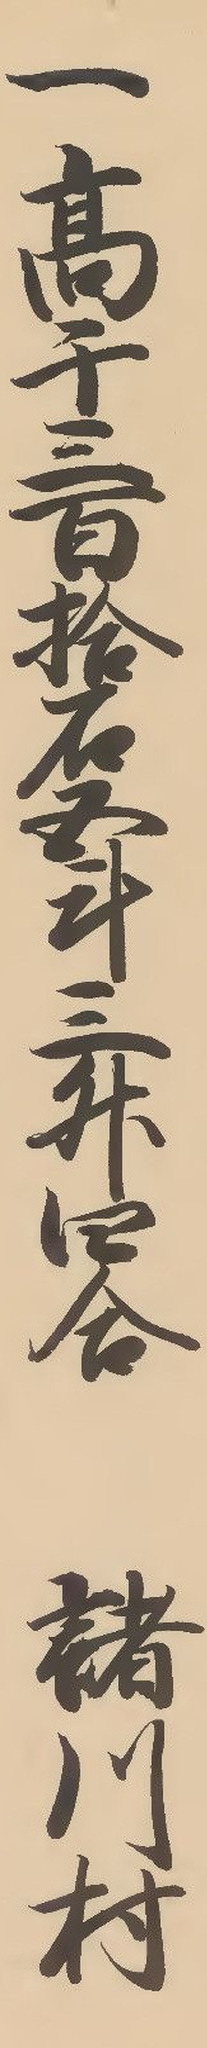一高千三百拾石五斗三升四合諸川村
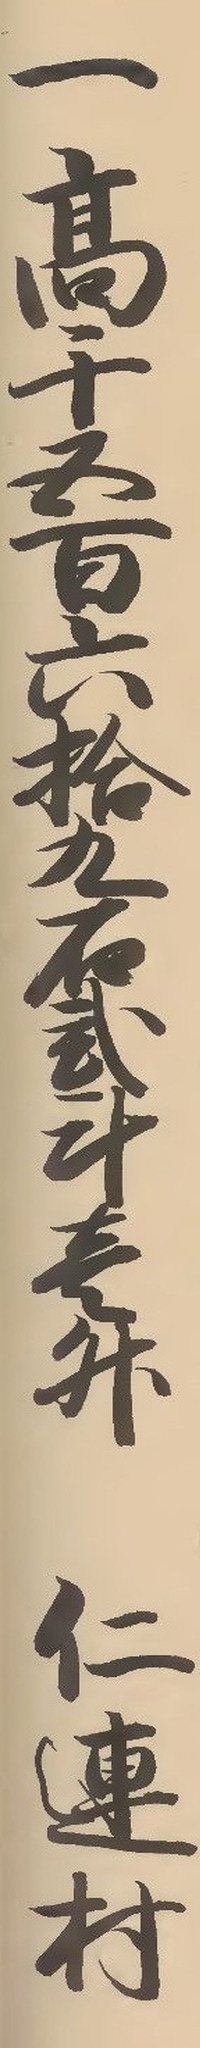一高千五百六拾九石弐斗壱升仁連村
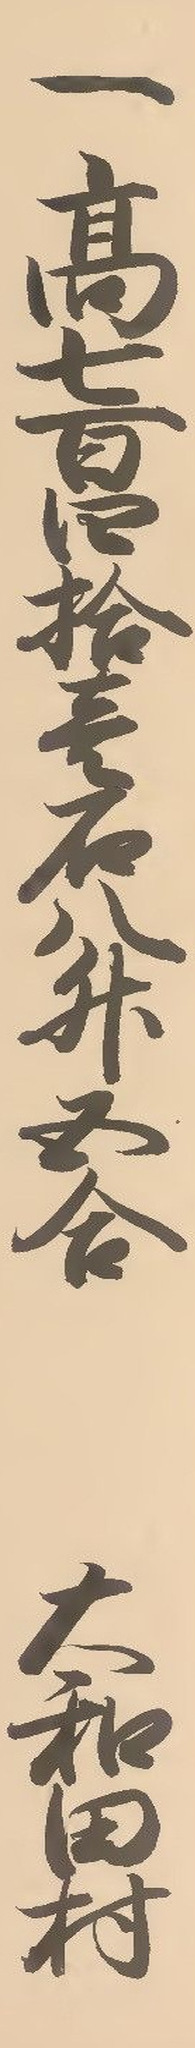一高七百四拾壱石八升五合大和田村
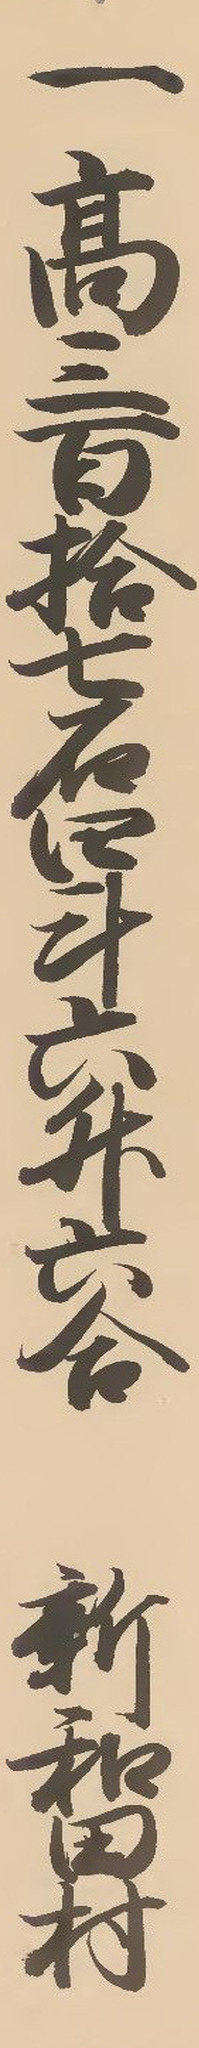一高三百拾七石四斗六升六合新和田村
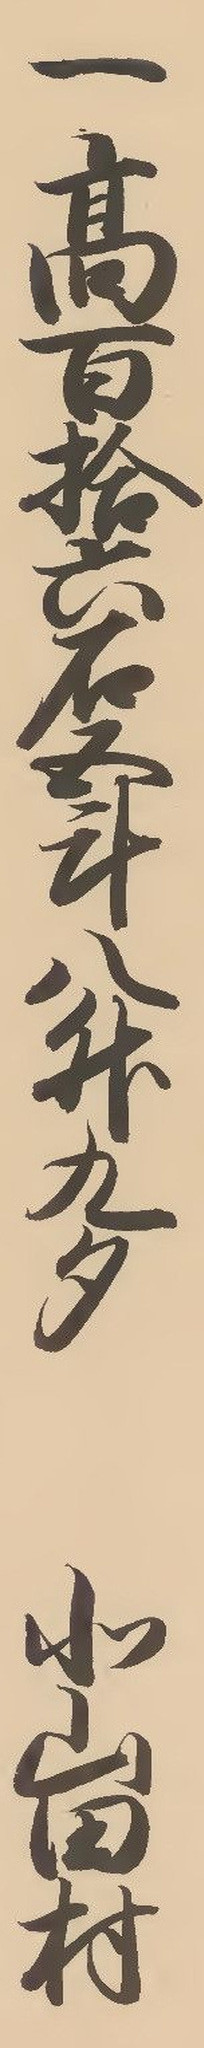一高百拾六石五斗八升九勺北山田村
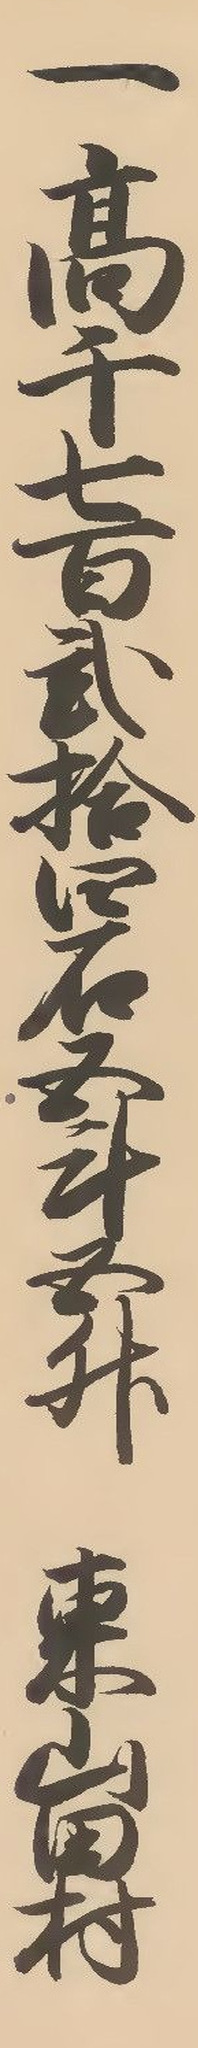一高千七百弐拾四石五斗五升東山田村
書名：下総国郷帳
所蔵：国立公文書館 National Archives of Japan
